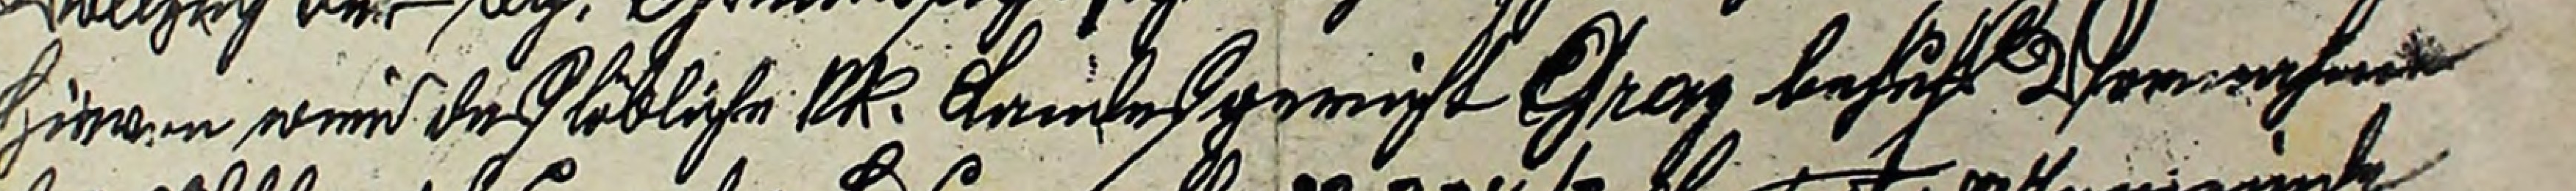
Hievon wird das löbliche kk. Landesgericht Graz behufs Vornahme
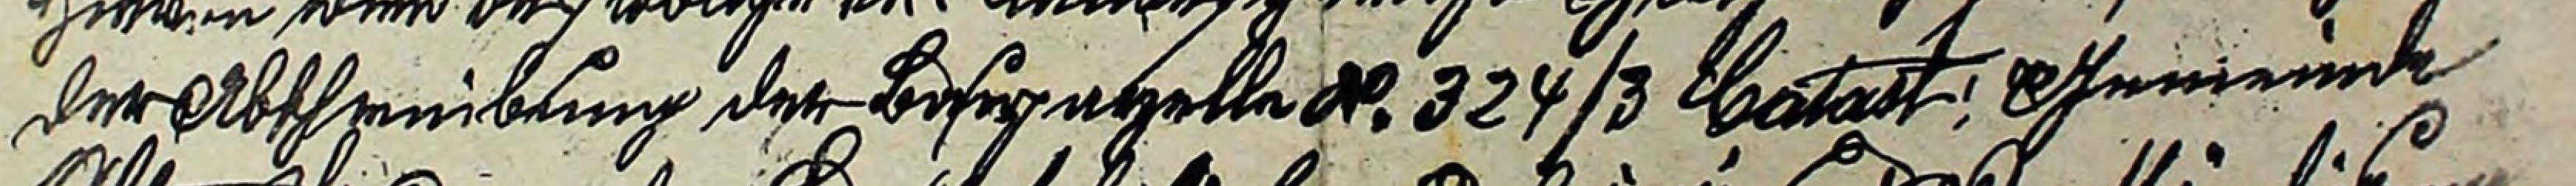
der Abschreibung der Bauparzelle No 324/3 Catast: Gemeinde
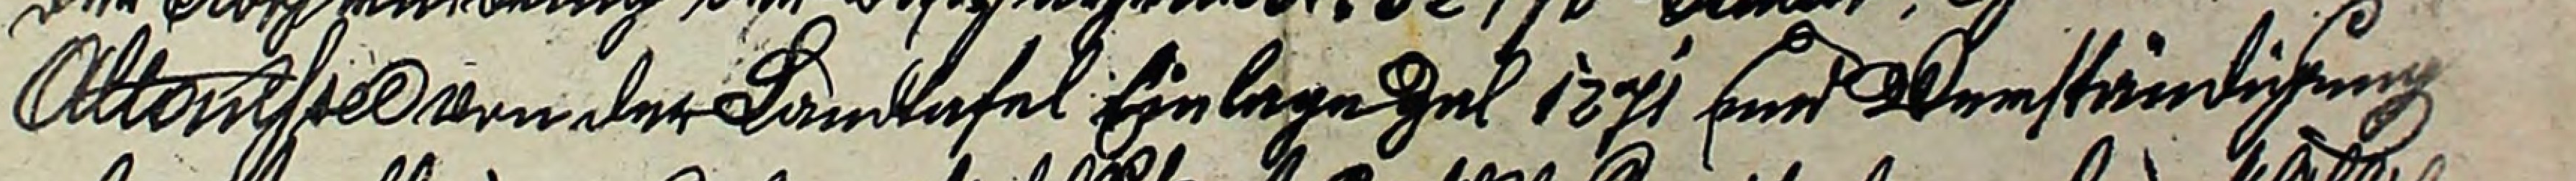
Altaussee von der Landtafel Einlage Zal 1271 und Verständigung
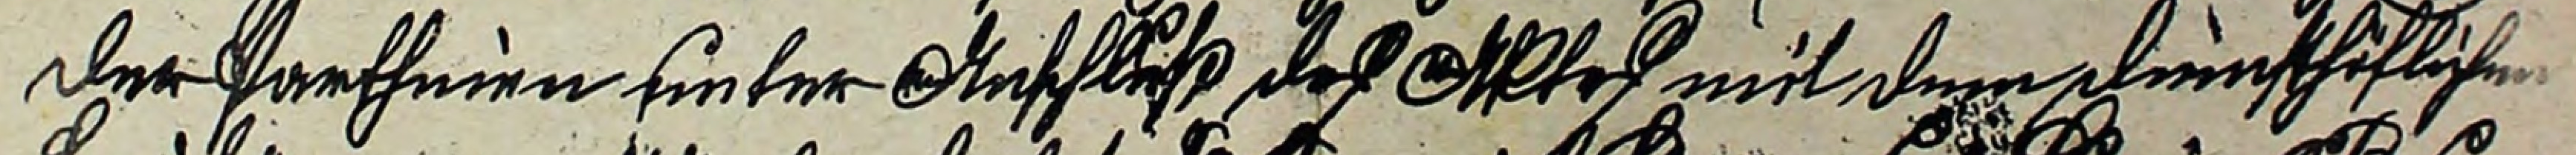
der Partheien unter Anschluss des Aktes mit dem Diensthöflichen
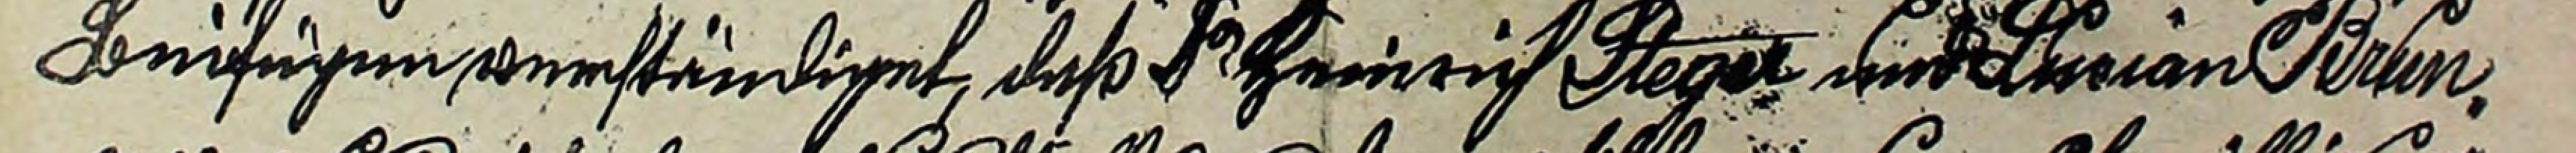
Beifügen verständiget, daß Dr Heinrich Steger und Lucian Brun„
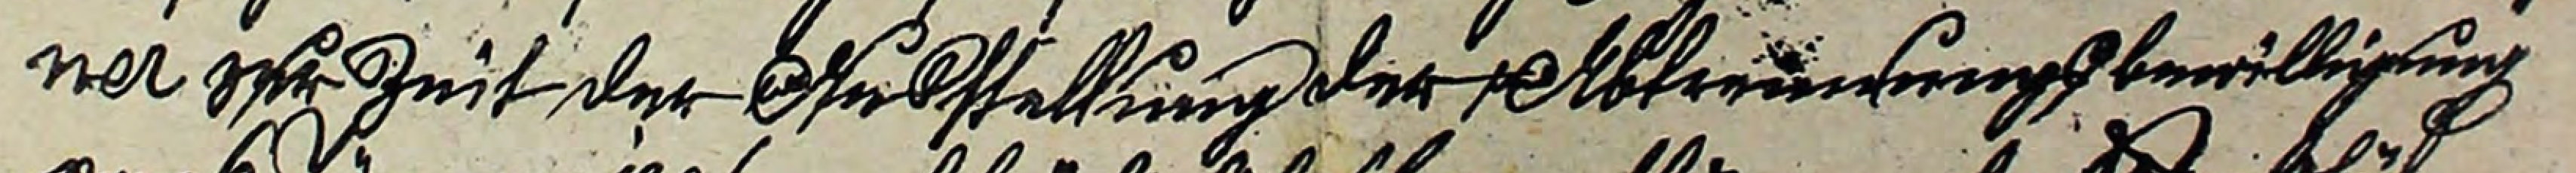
ner zur Zeit der Ausstellung der Abtrennungsbewilligung
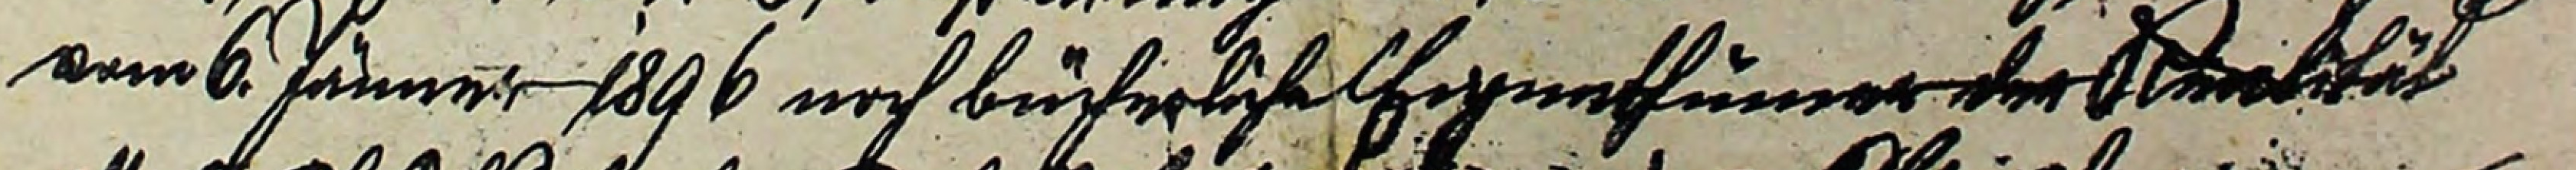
am 6. Jänner — 1896 noch bücherliche Eigenthumer der Realität
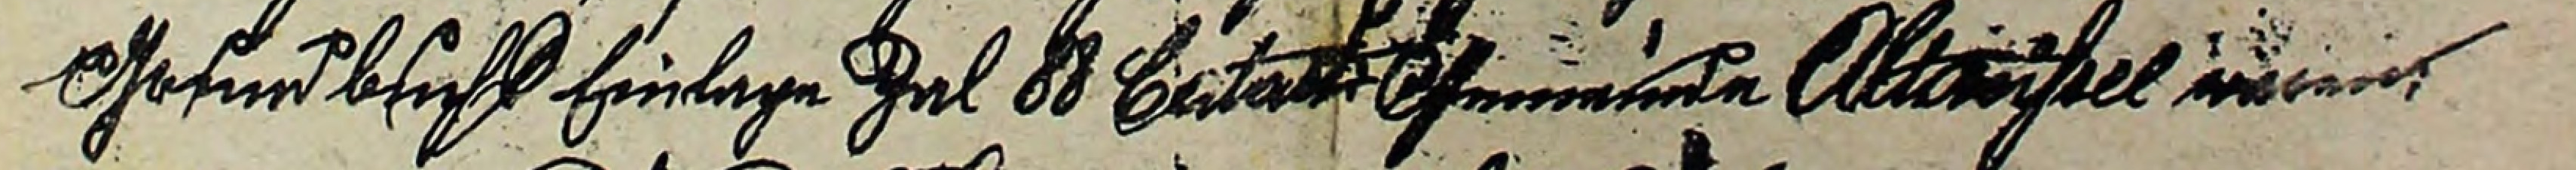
Grundbuchs Einlage Zal 88 Catast. Gemeinde Altaussee einem
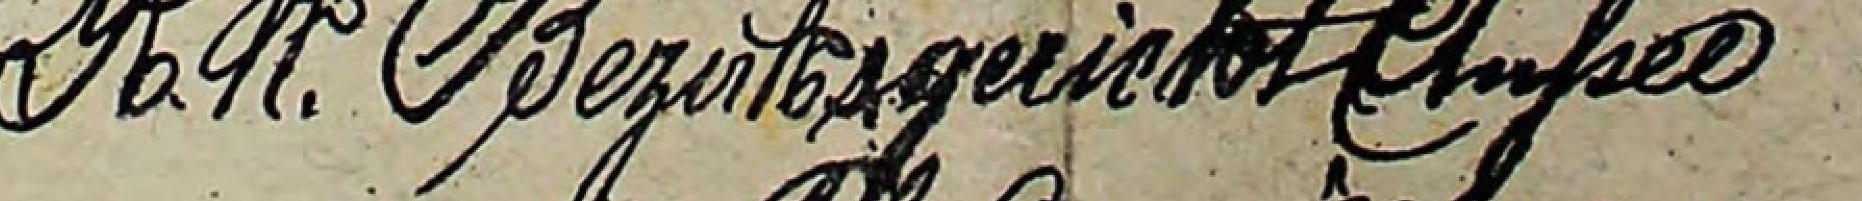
k.k. Bezirksgericht Aussee
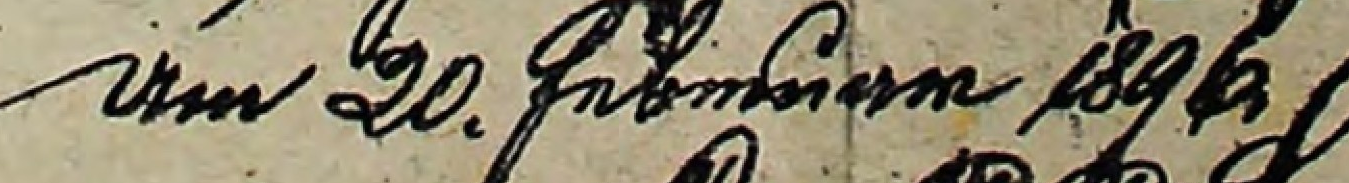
am 20. Februar 1896.
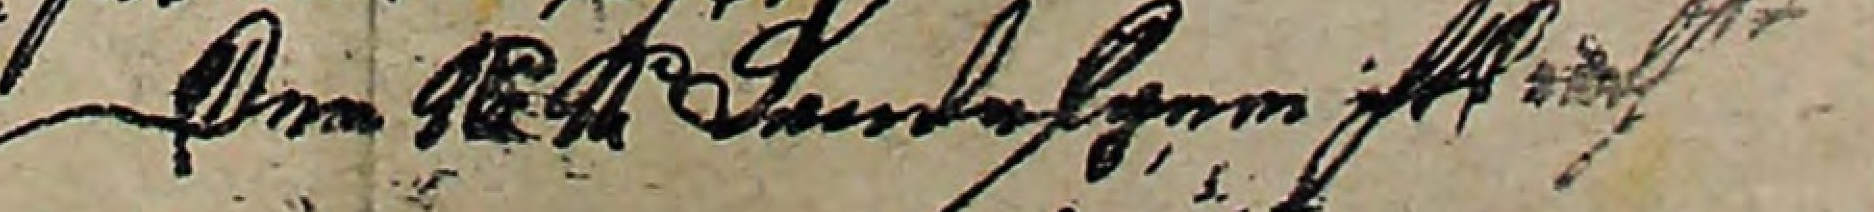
Der k.k Sandergerichtsrecht
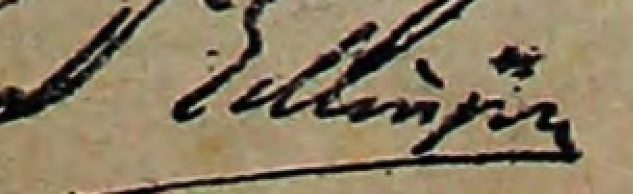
S. Edlingen
